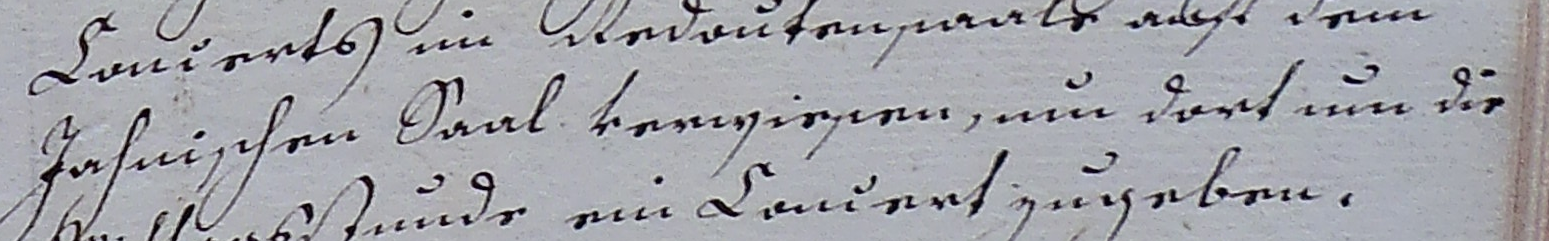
Jahnischen Saal verwiesen, um dort um die
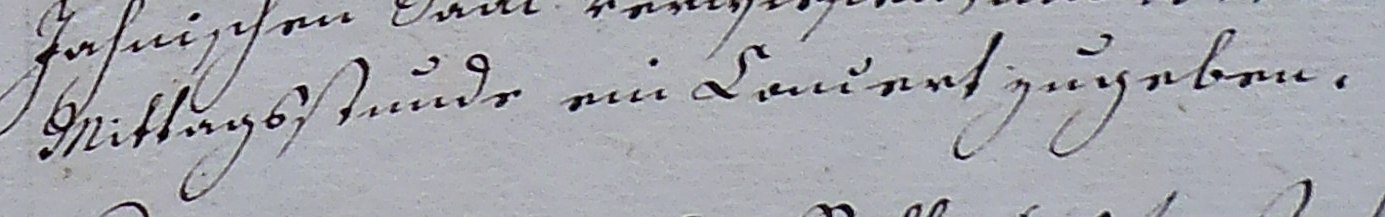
Mittagsstunde ein Concert zugeben.
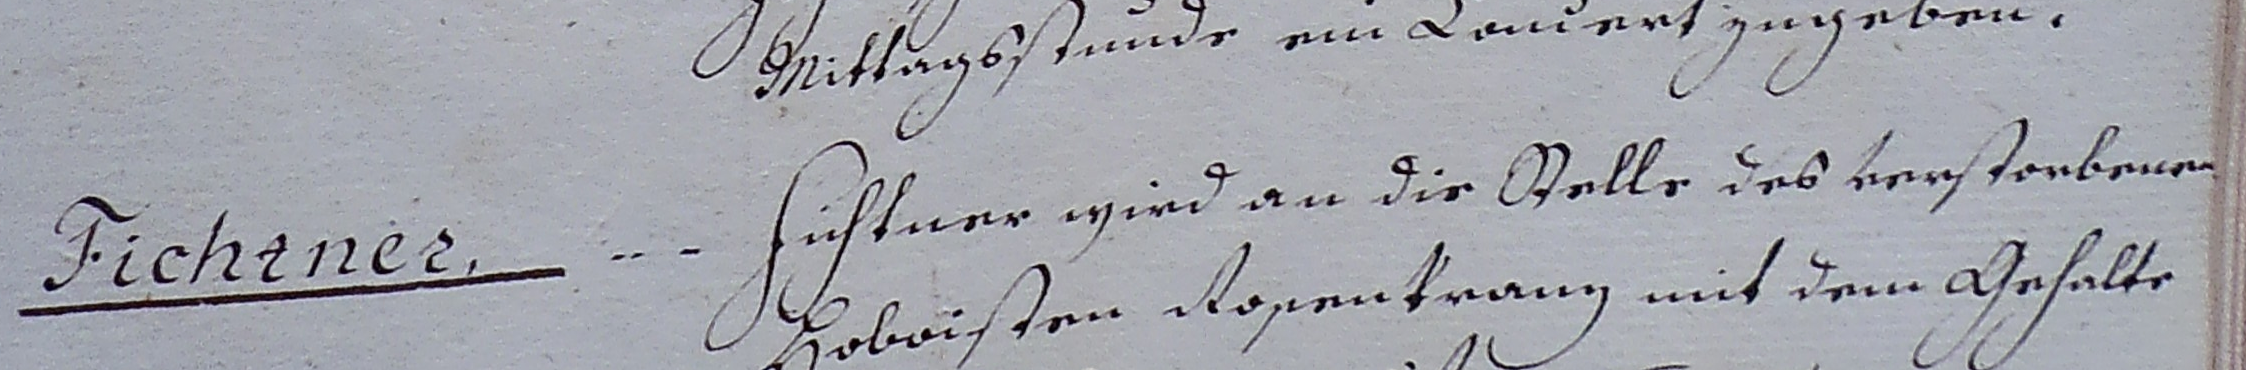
Fichtner. .. .. Fichtner wird an die Stelle des verstorbenen
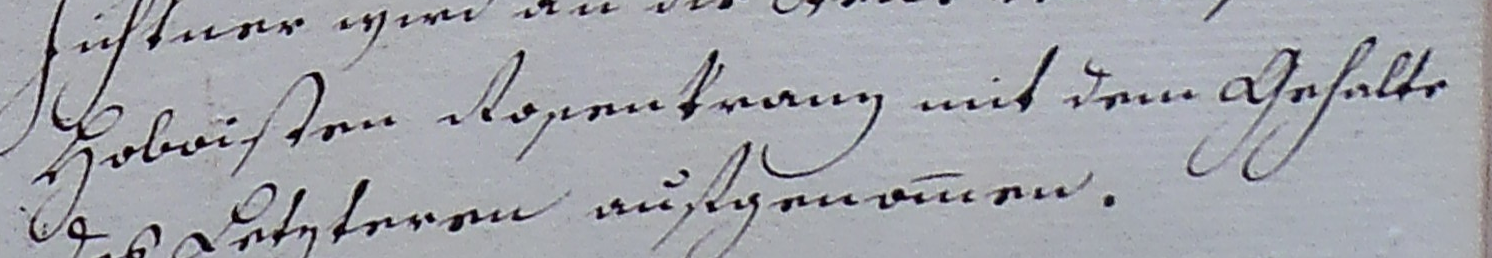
Hoboisten Rosenktranz mit dem Gehalte
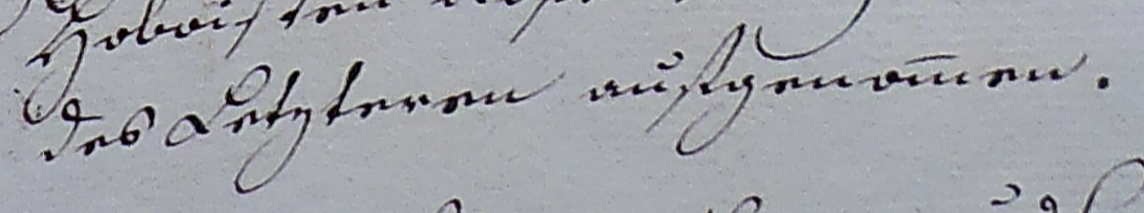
des Letzteren aufgenom̅en.
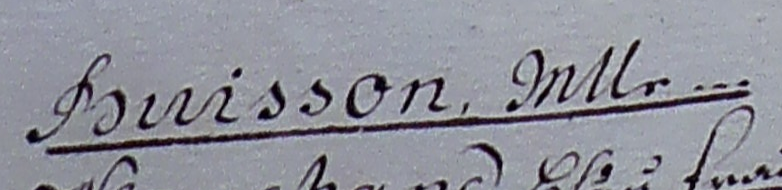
Buisson, Mlle ...
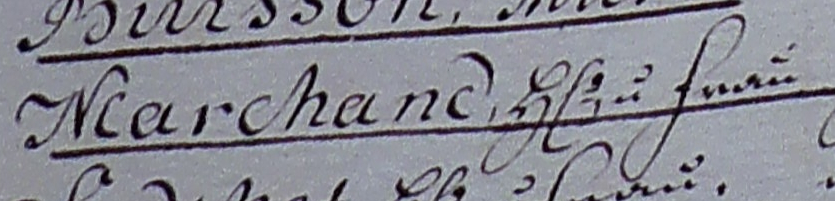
Marchand, HEr͇ u Frau
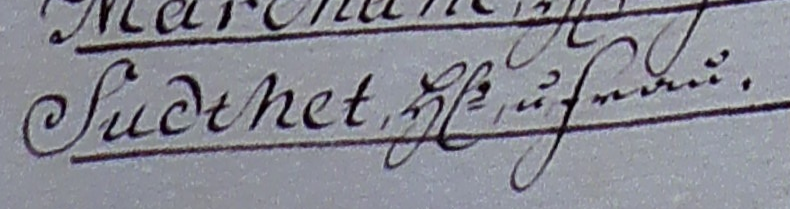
Sudthet, HEr͇ u Frau.
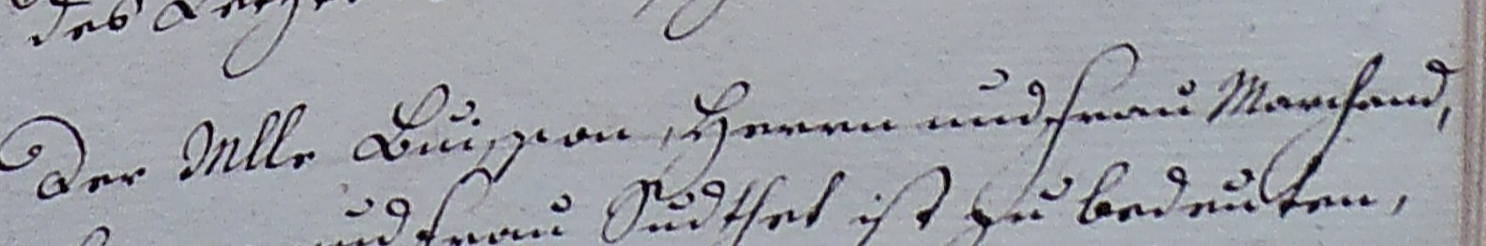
Der Mlle Buisson, Herrn und Frau Marchand,
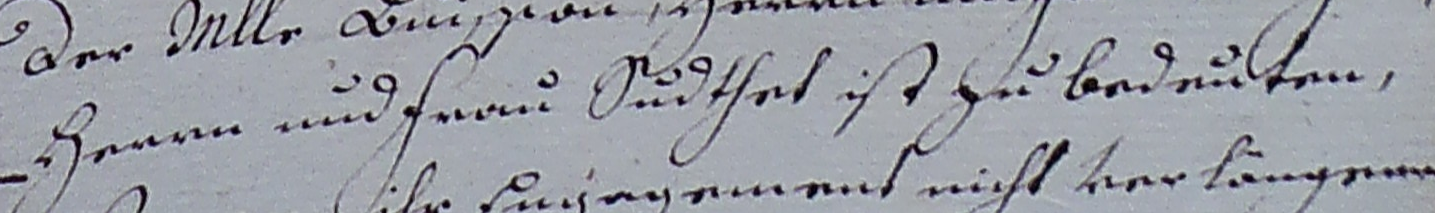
Heaan und Frau Sudthet ist zu bedeuten,
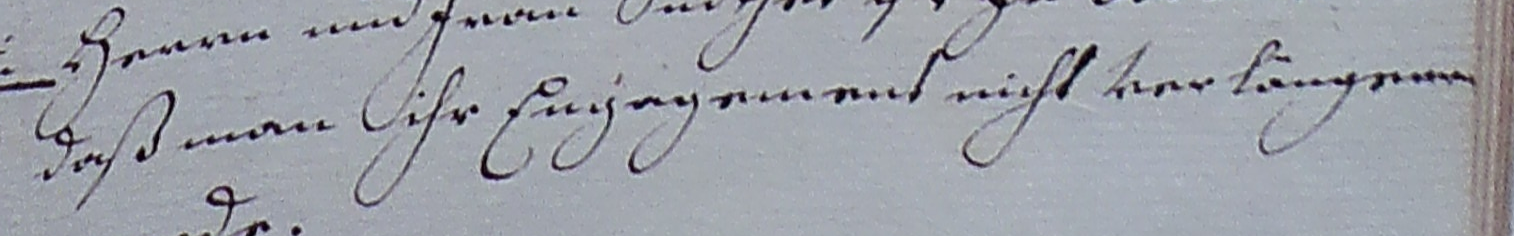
daß man ihr Engegement nicht verlängern
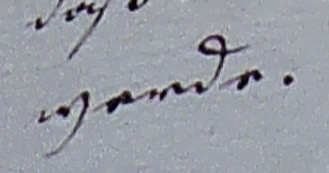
werde.
